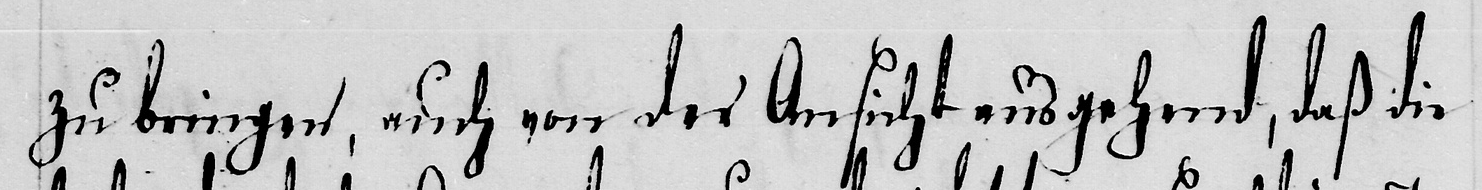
zu bringen, auch von der Ansicht ausgehend, daß die
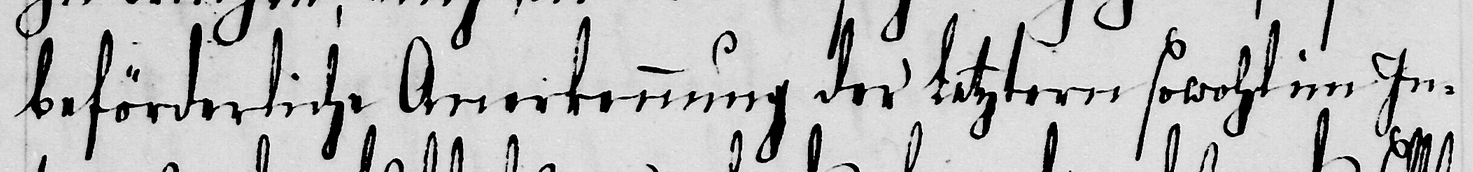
beförderliche Anerkennung der Letztern sowohl im In¬
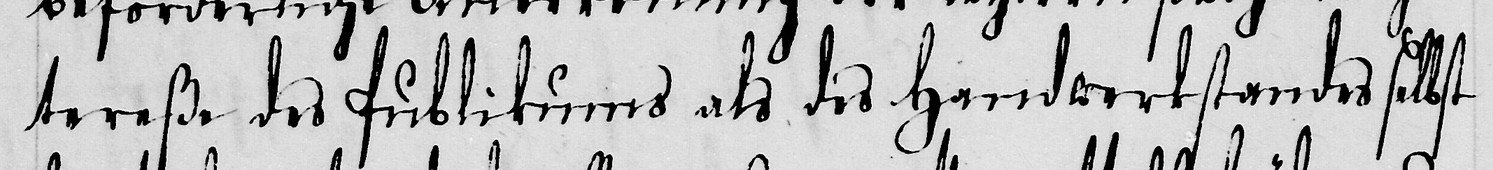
tereße des Publikums als des Handwerkstandes selbst
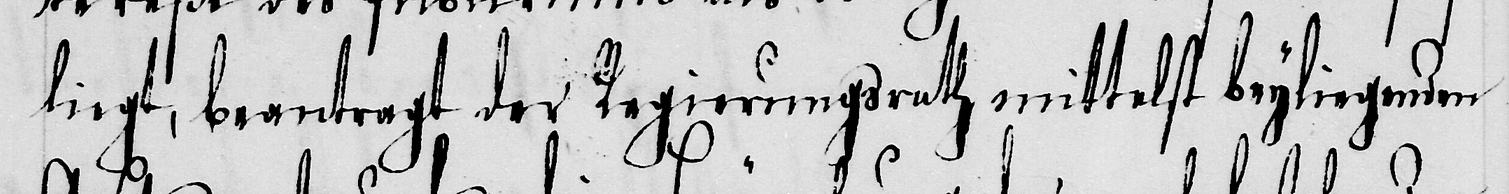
liegt, beantragt der Regierungsrath mittelst beyliegenden
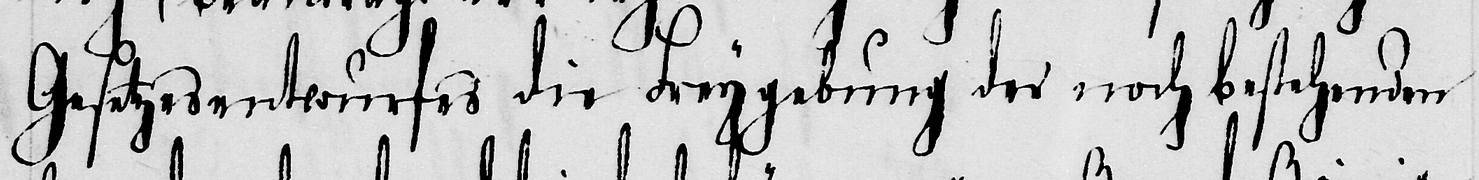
Gesetzesentwurfes die Freygebung der noch bestehenden
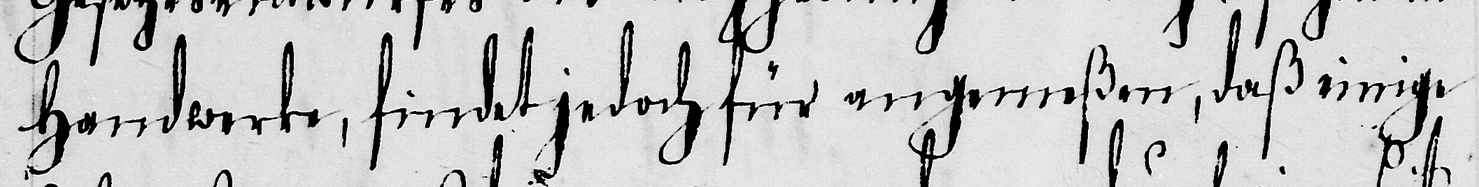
Handwerke, findet jedoch für angemeßen, daß einige
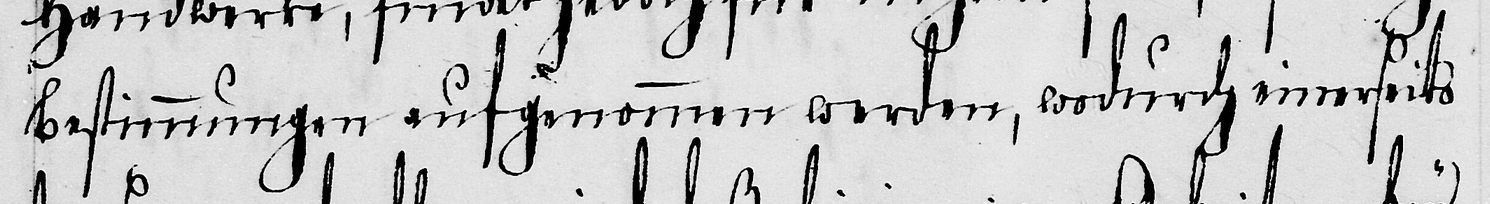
Bestimmungen aufgenommen werden, wodurch einerseits
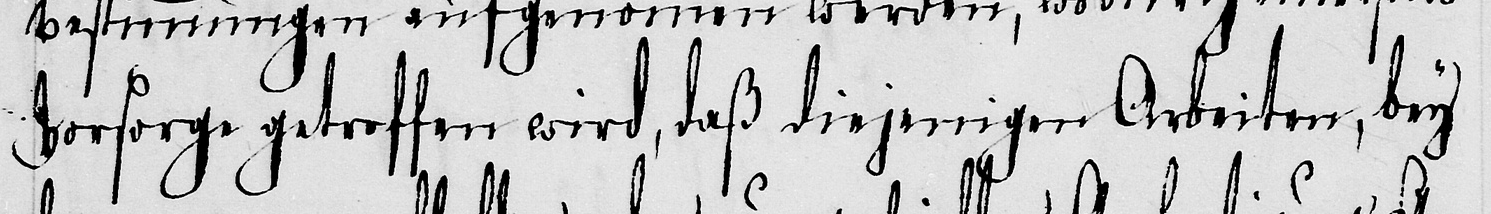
Vorsorge getroffen wird, daß diejenigen Arbeiten, bey
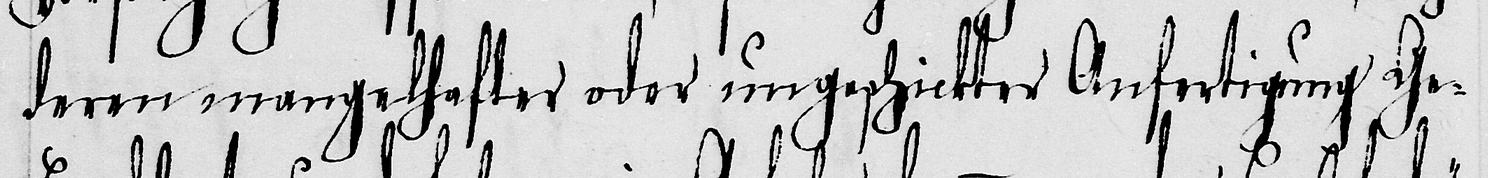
deren mangelhafter oder ungeschickter Anfertigung Ge¬
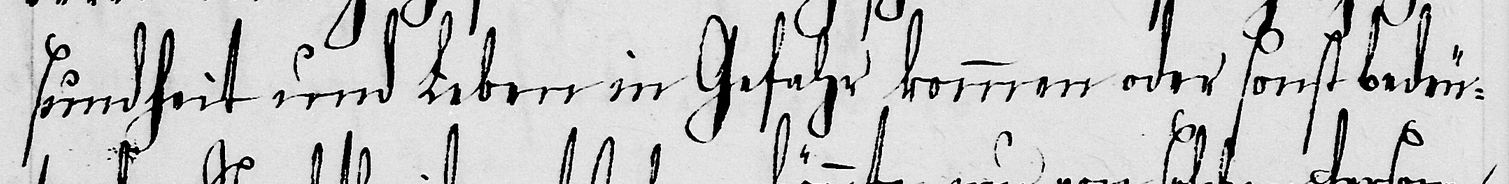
sundheit und Leben in Gefahr kommen oder sonst bedeu¬
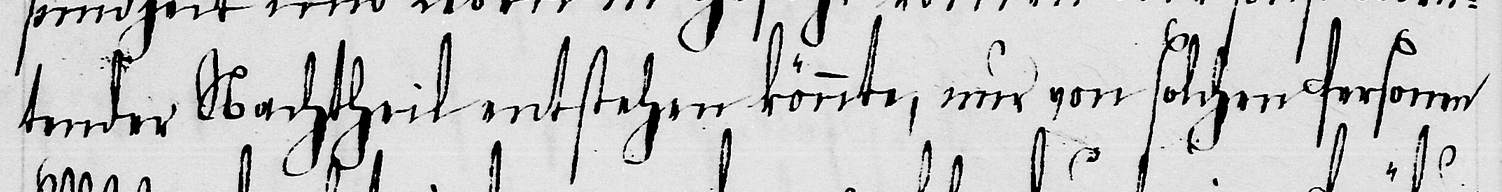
tender Nachtheil entstehen könnte, nur von solchen Personen
